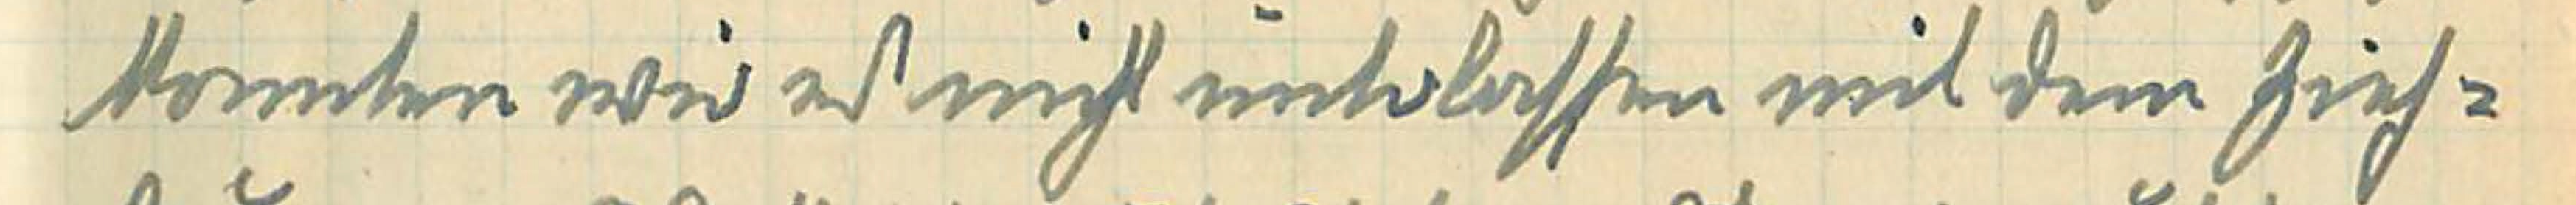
konnten wir es nicht unterlassen mit dem Zieh-
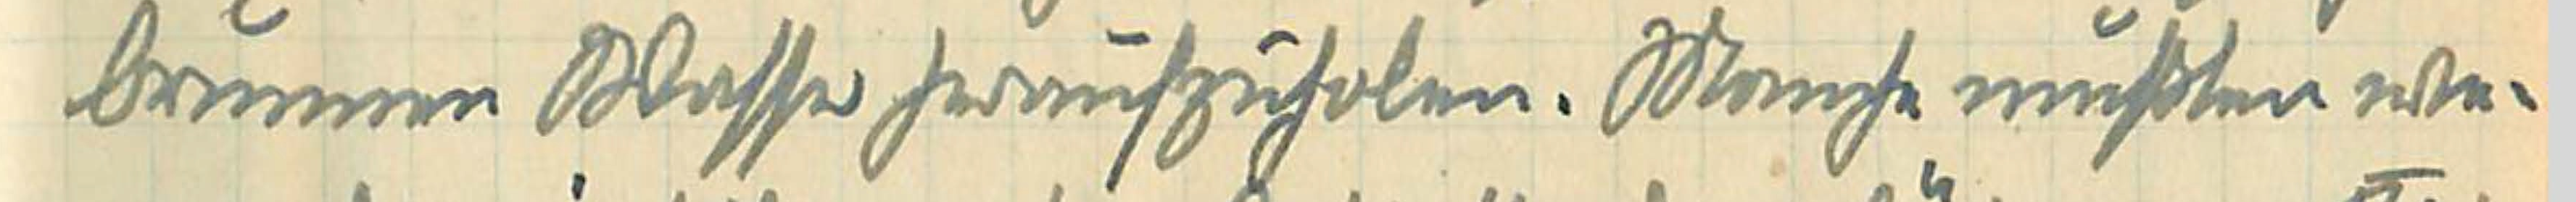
brunnen Wasser heraufzuholen. Manche mußten we-
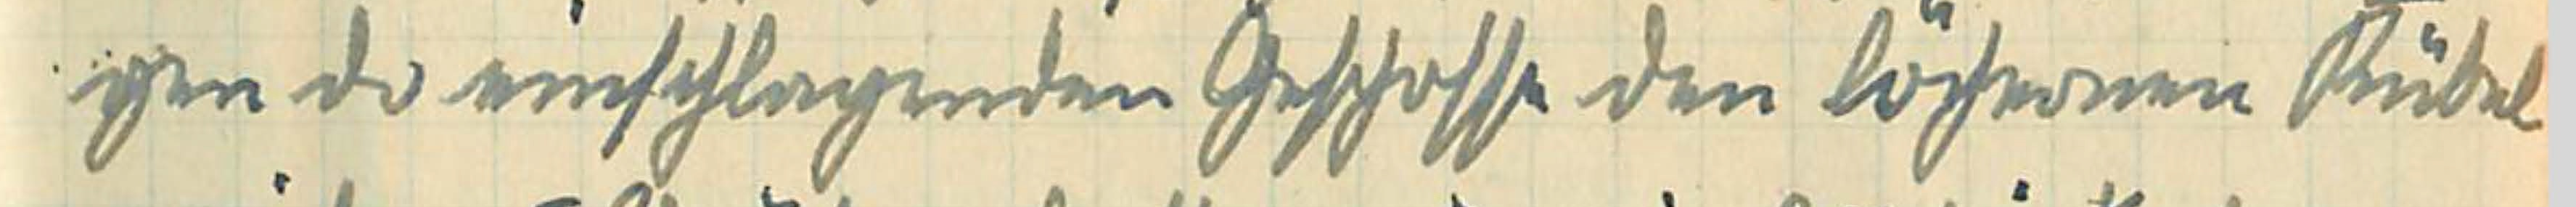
gen der einschlagenden Geschosse den löchernen Kübel
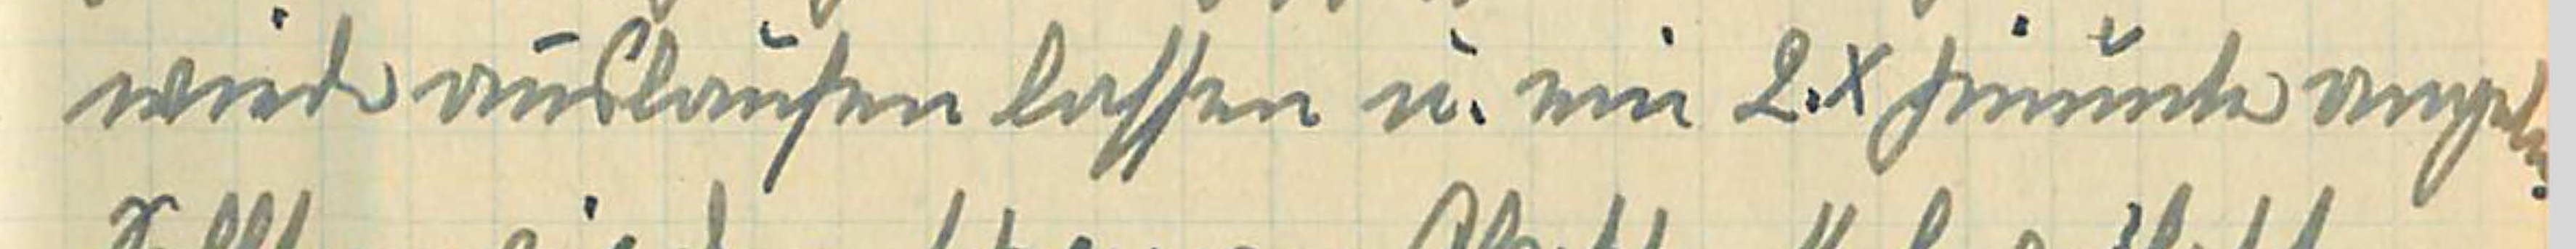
wieder auslaufen lassen u. ein 2.x hinunter angehen.
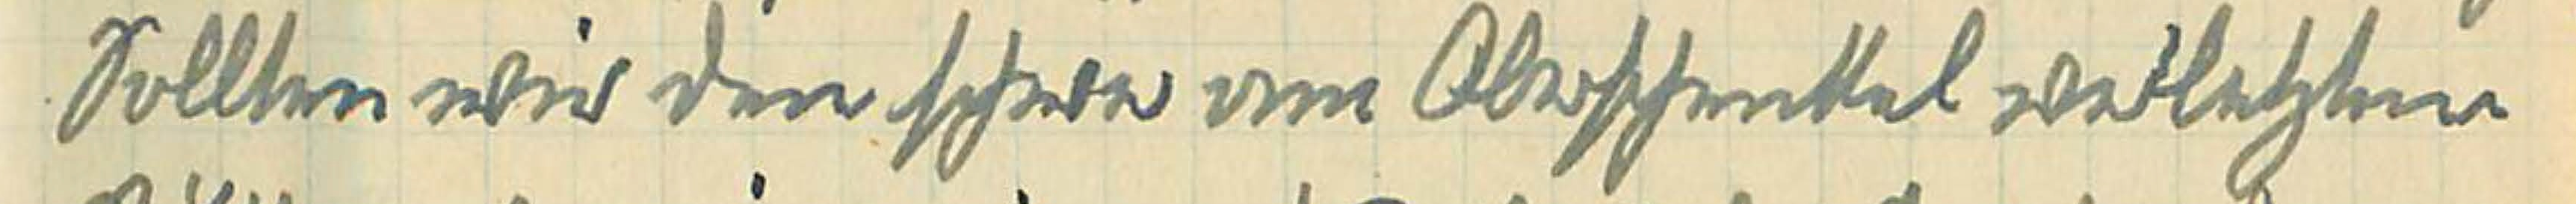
Sollten wir den schwer am Oberschenkel verletzten
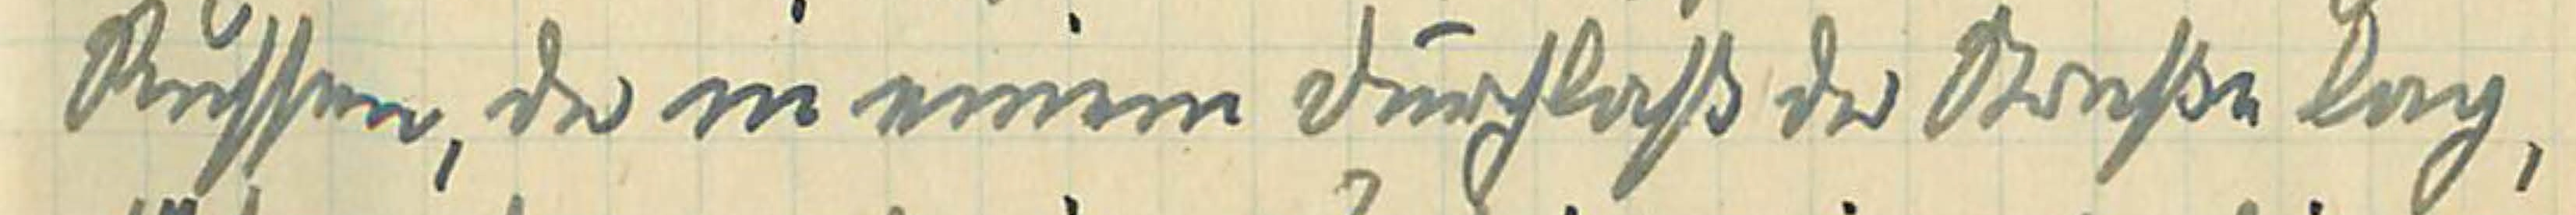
Russen, der in einem Durchlaß der Straße lag,
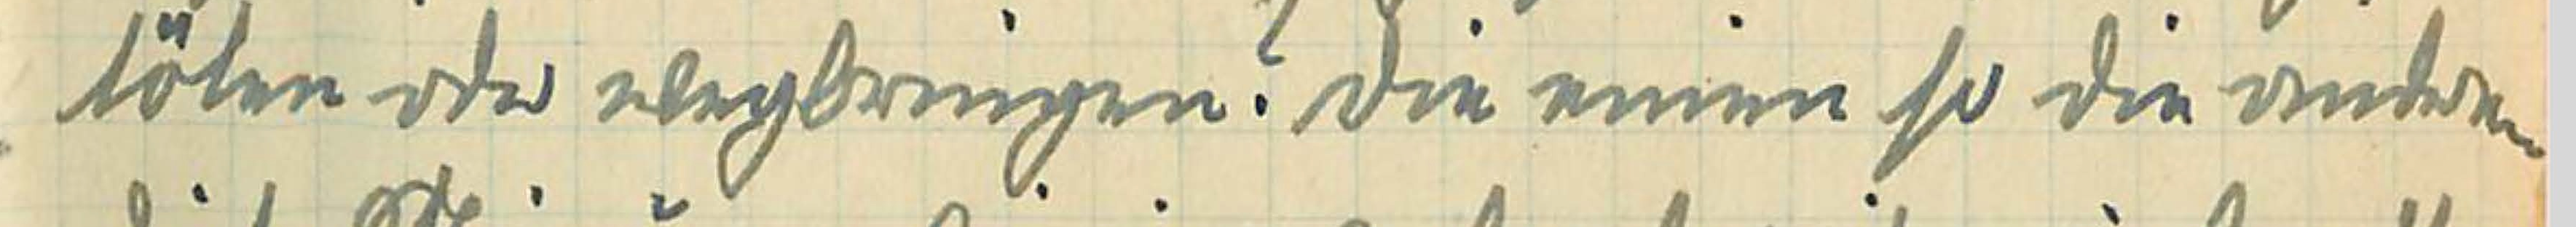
töten oder wegbringen? Die einen so die anderen
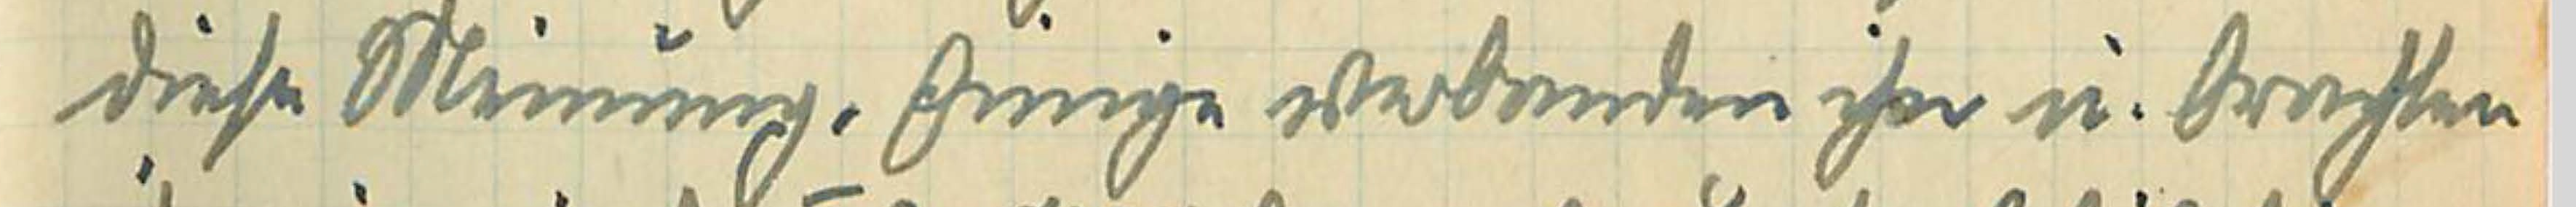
diese Meinung. Einige verbanden ihn u. brachten
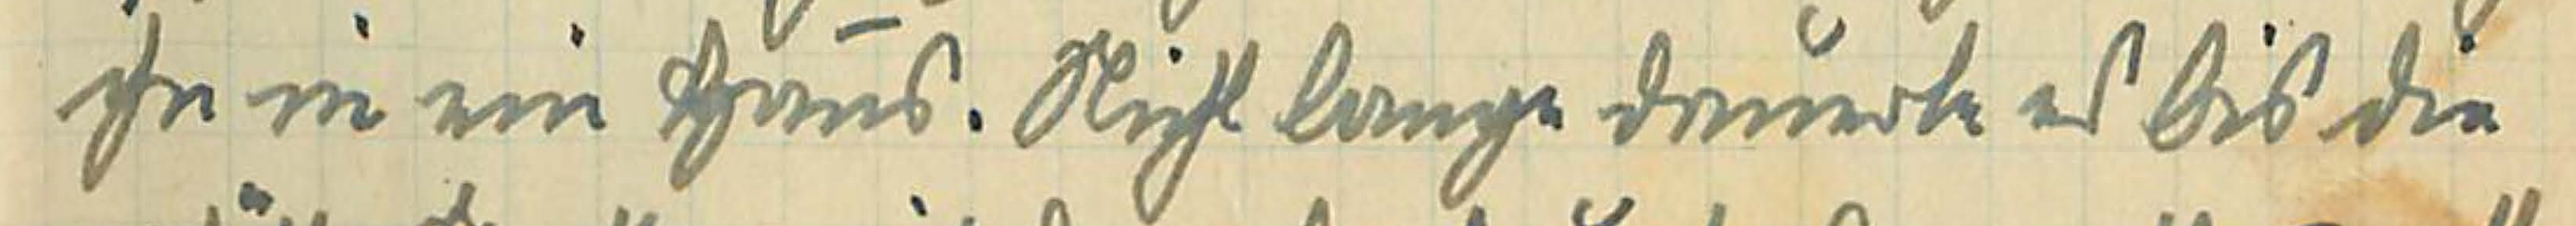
ihn in ein Haus. Nicht lange dauerte es bis die
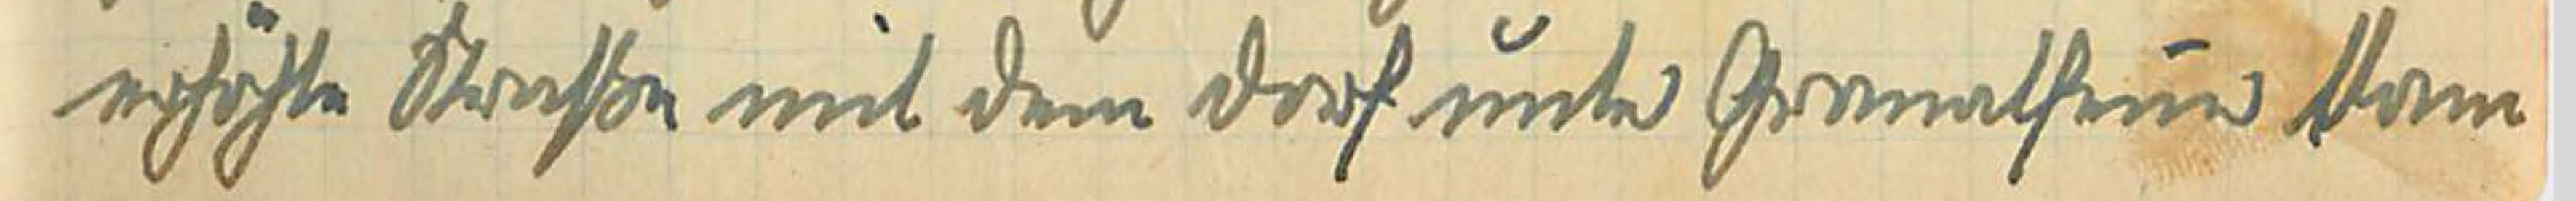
erhöhte Straße mit dem Dorf unter Granatfeuer kam
